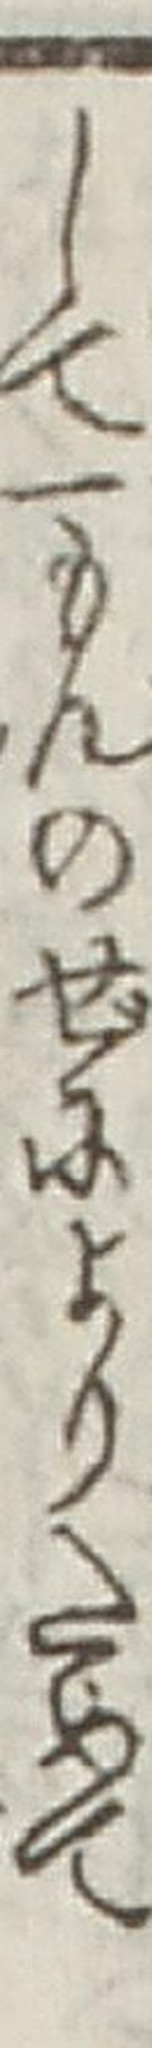して一もんのぜによりためて
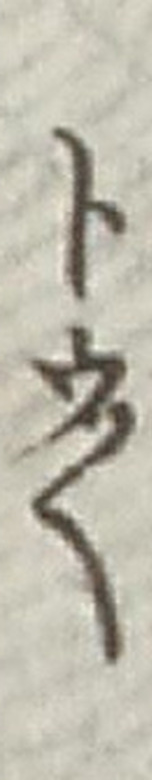トウ〳〵
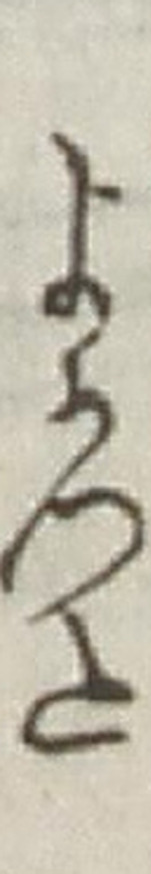よかつた
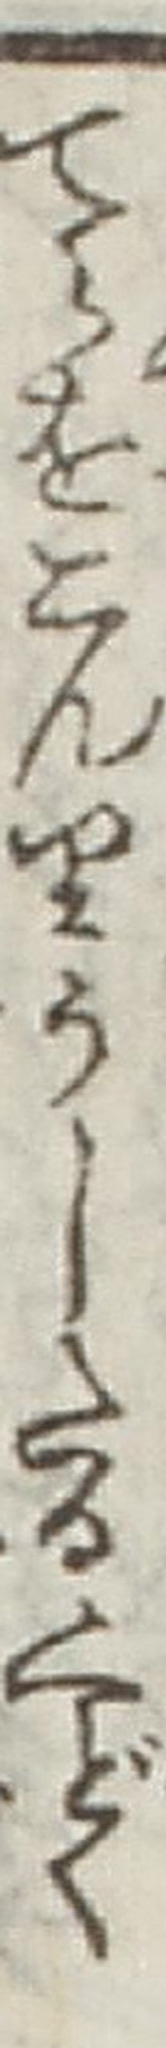てらをこんりうしたるくどく
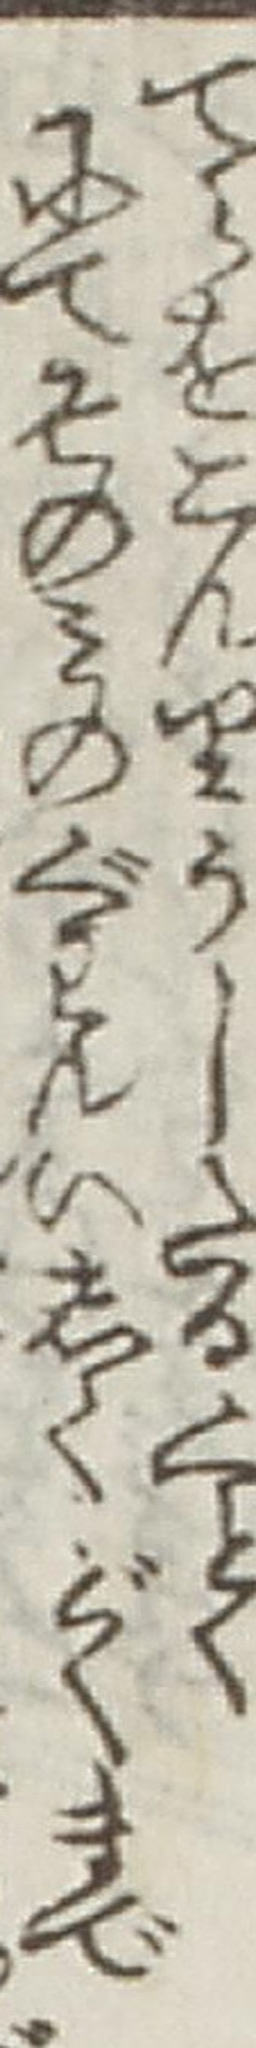にてそのみのぐわんいしくどくまで
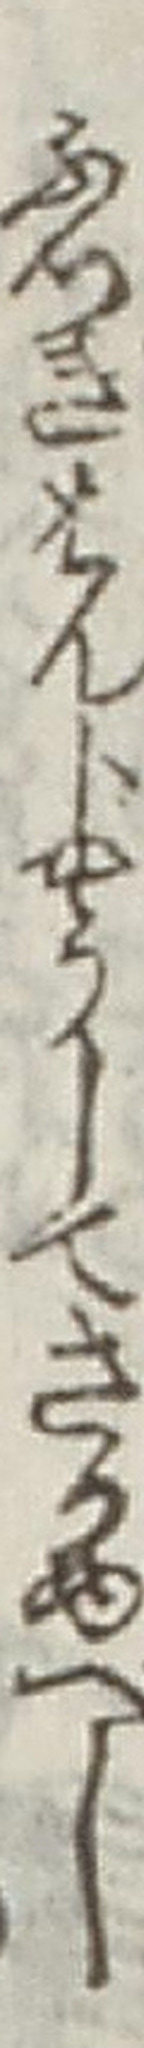ふつきはんじやうしてさかゆべし
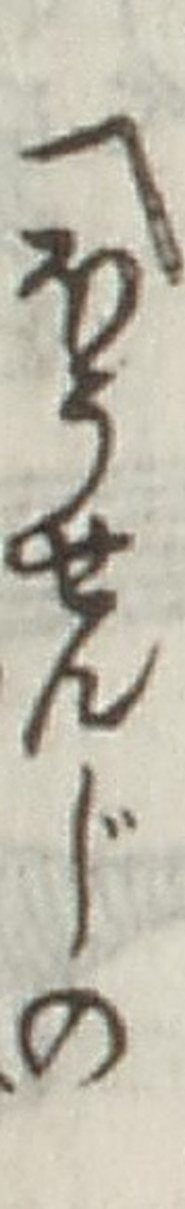〽ほうせんじの
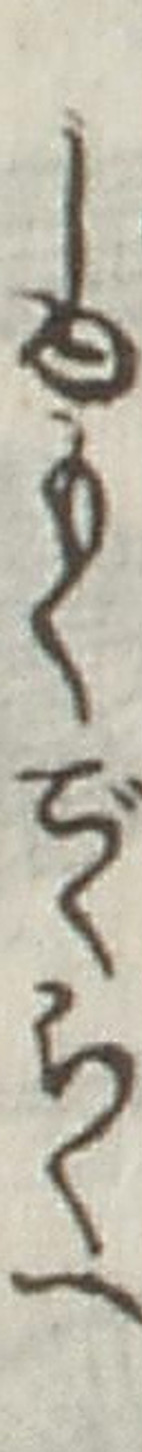しゆもくごくらくへ
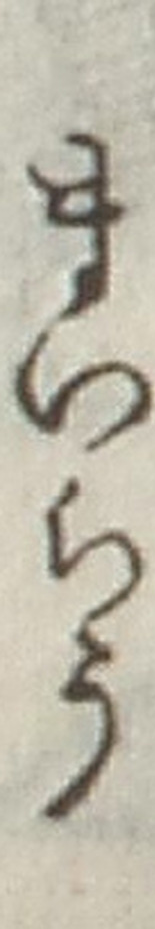まいらう

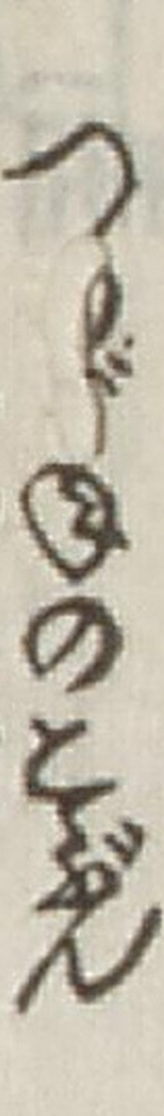つねのこぶん
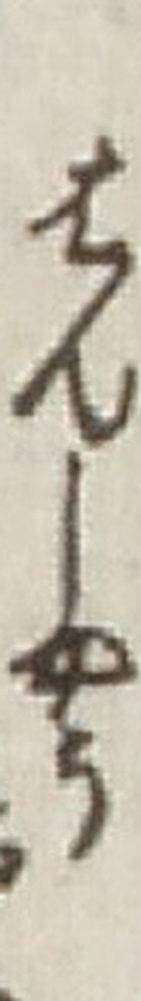はんしやう
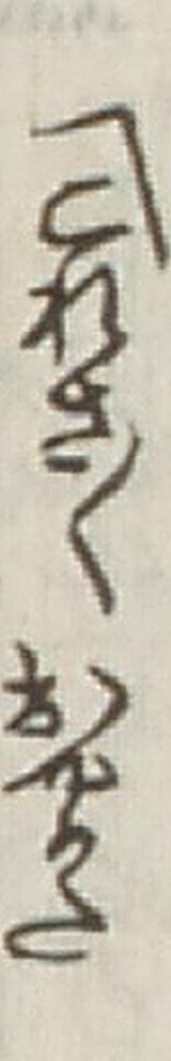〽これさ〳〵おやかた
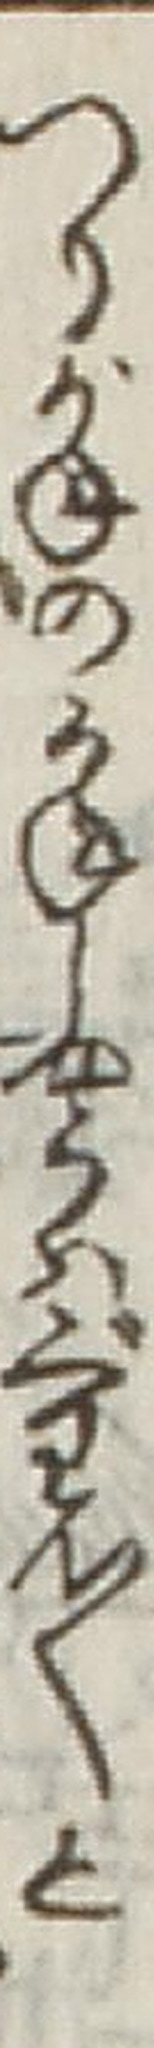つりがねのかねしやうはぐわん〳〵と
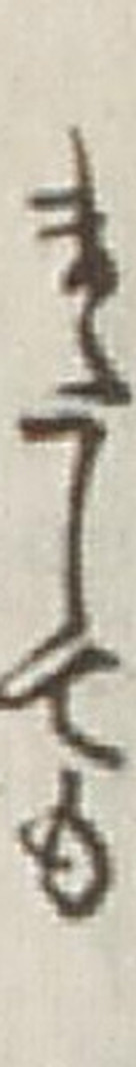またしても
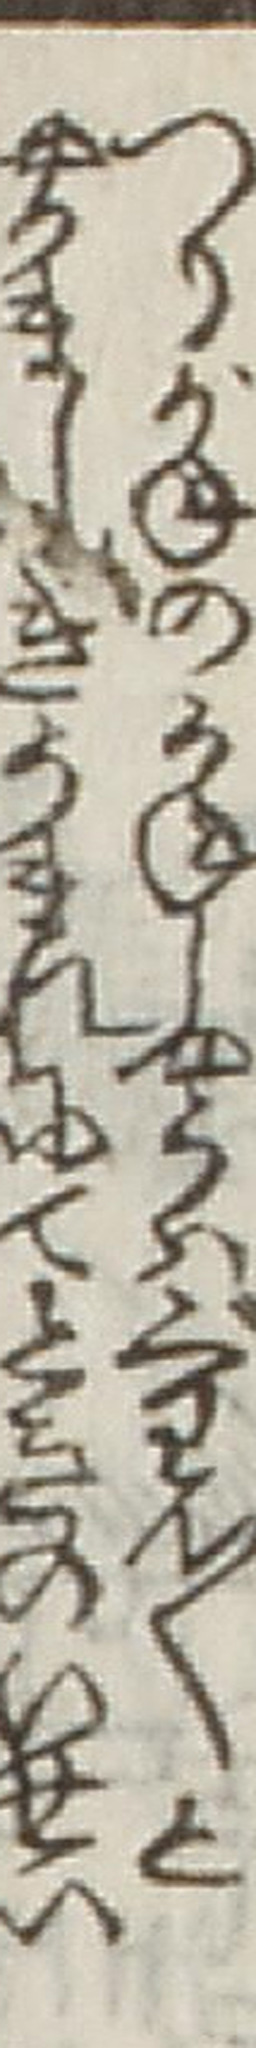やかましきうまれにてときのいせい
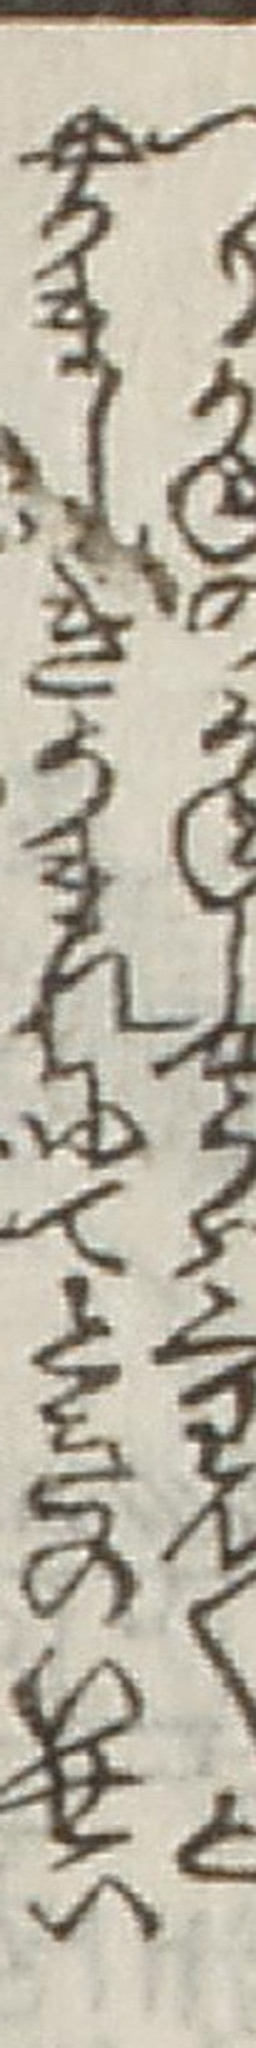やかましきうまれにてときのいせい
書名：三世相出雲當座帳　上下冊
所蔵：東京大学地震研究所図書室 Earthquake Research Institute Library, The University of Tokyo, JAPAN
